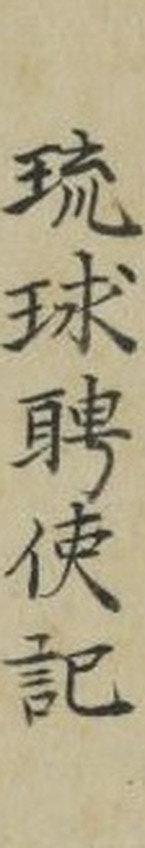琉球聘使記
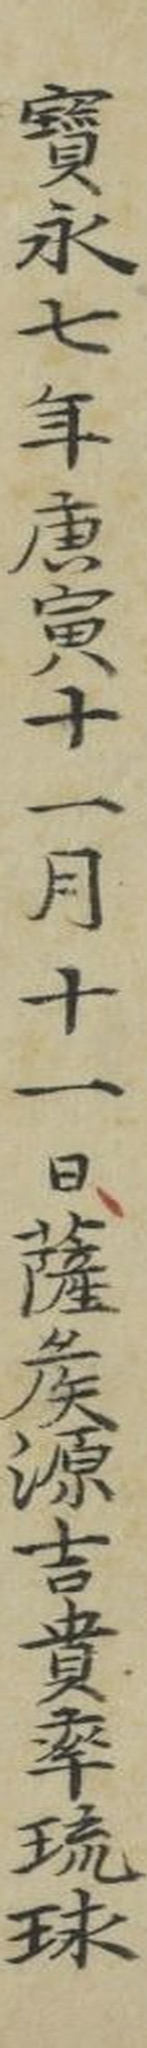寶永七年庚寅十一月十一日、薩疾源吉貴率琉球
